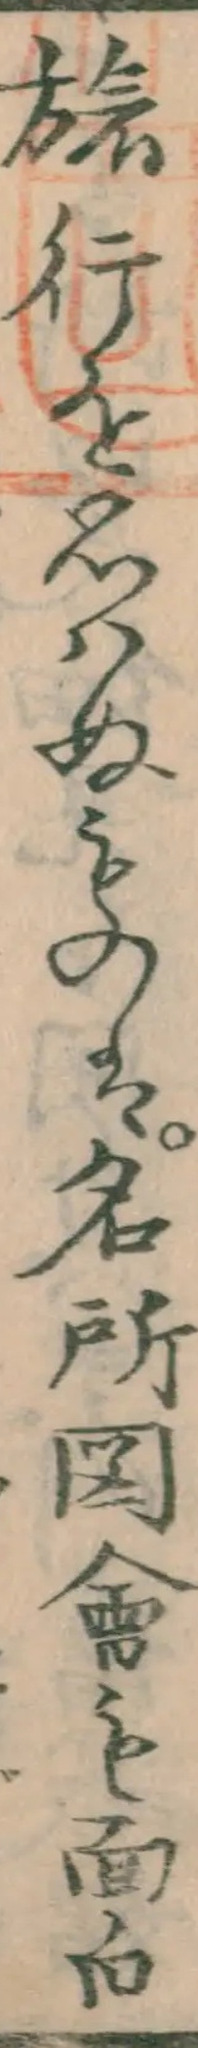旅行を思はぬものは。名所図会も面白
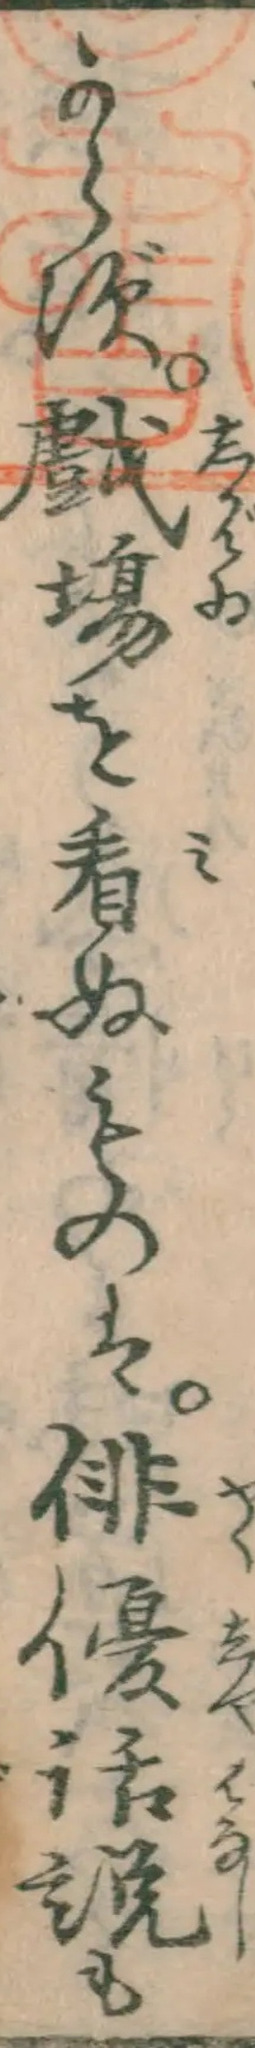からず。戯場を看ぬものは。俳優話説も
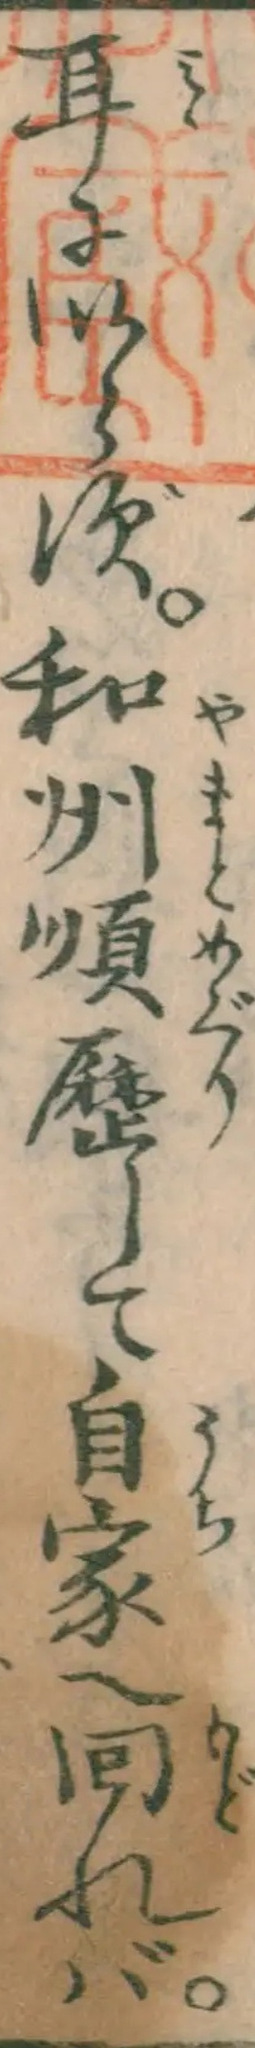耳にいらず。和州順歴して自家へ回れば。
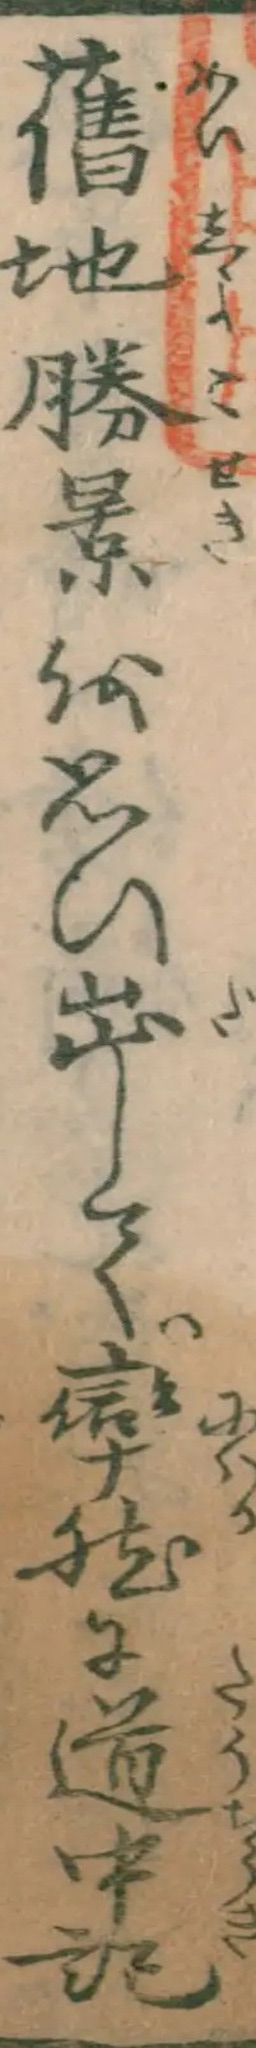旧地勝景を思ひ出して。卒然に道中記
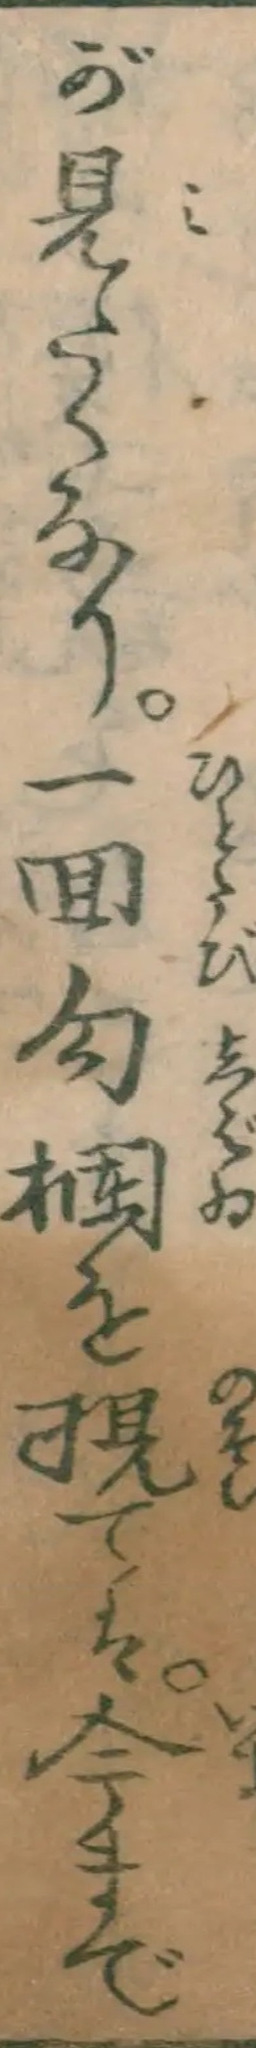が見たくなり。一回勾欄を覗ては。今まで

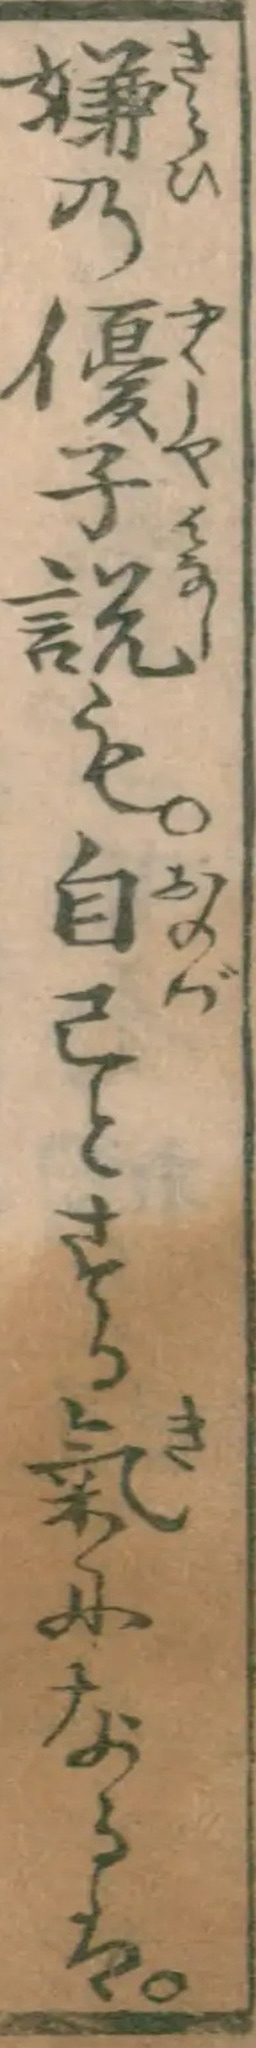嫌の優子説も。自己とする気になるは。
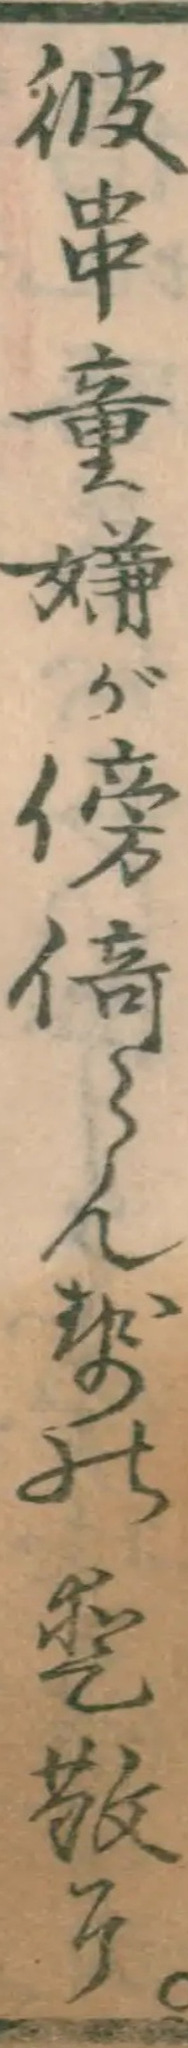彼串童嫌が傍椅らん勢の愛敬に。
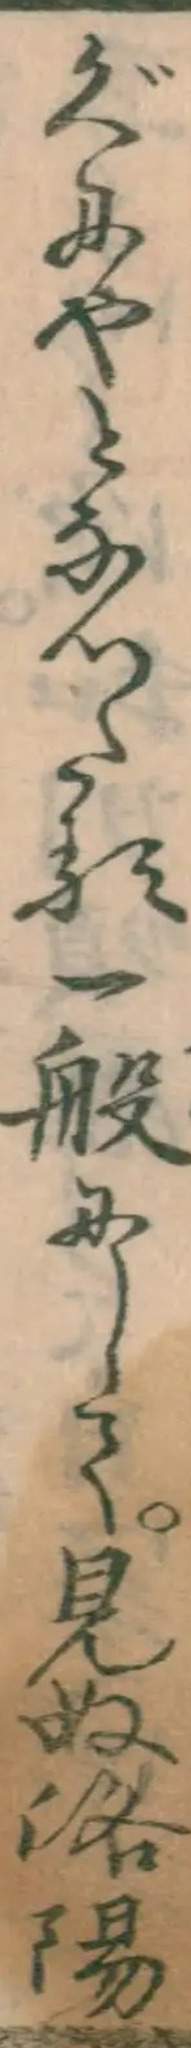ぐにやとなつたる一般にして。見ぬ洛陽
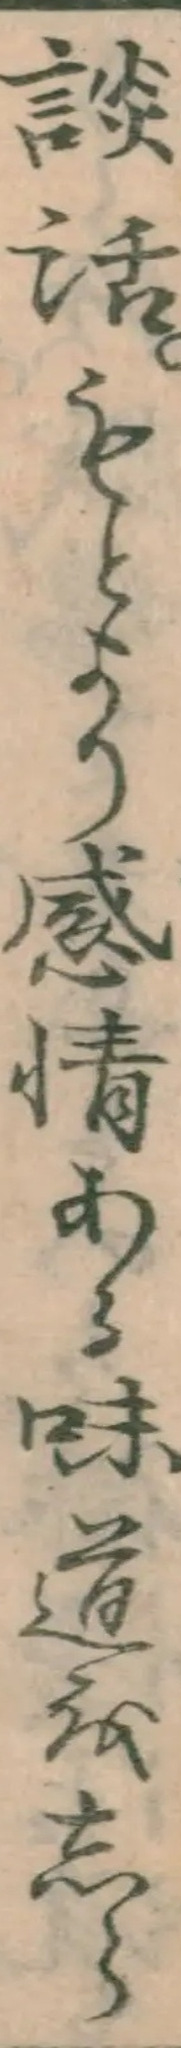談話。もとより感情ある味道をしら
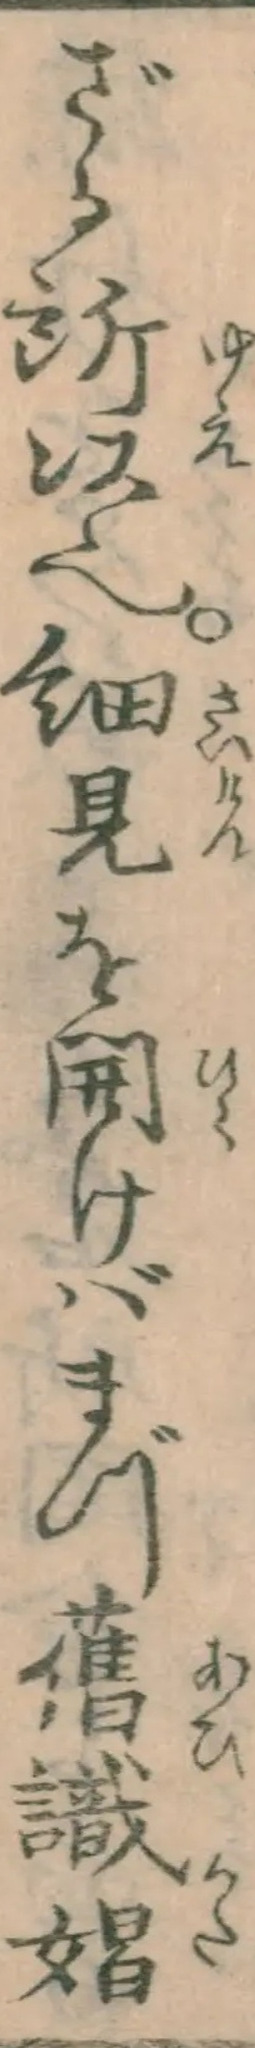ざる所以也。細見を開けばまづ旧敷娼
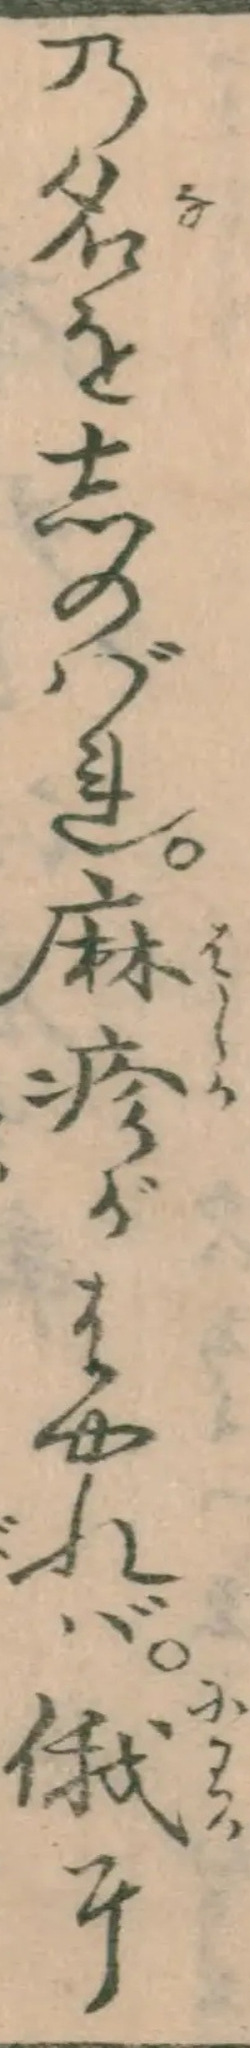の名をしのばれ。麻疹がはやれば。俄に
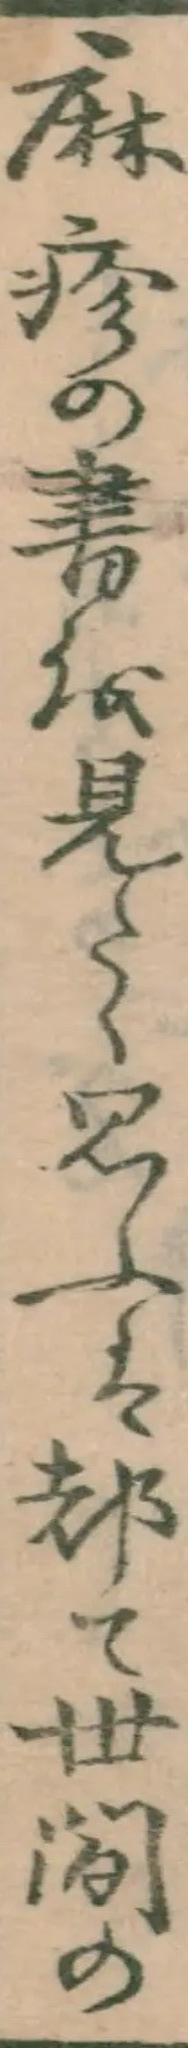麻疹の書を見たく思ふは。都て世間の
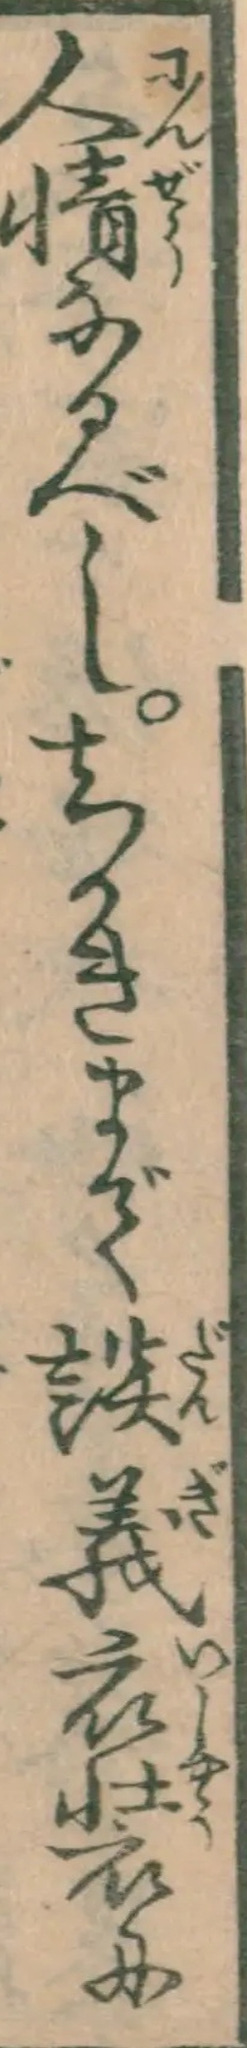人情なるべし。ちかきまで段義衣装に
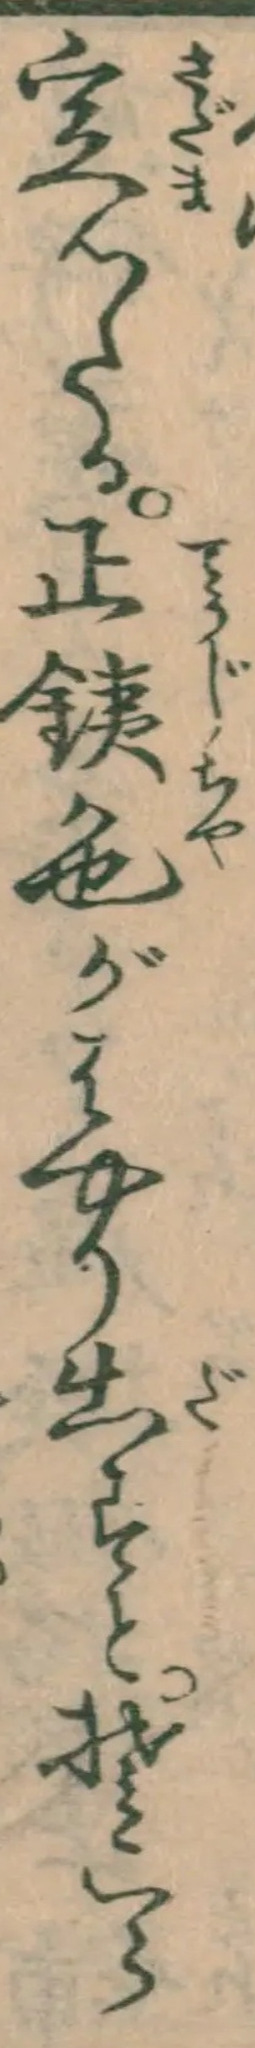定つたる。正銕色がはやり出すと。そこら
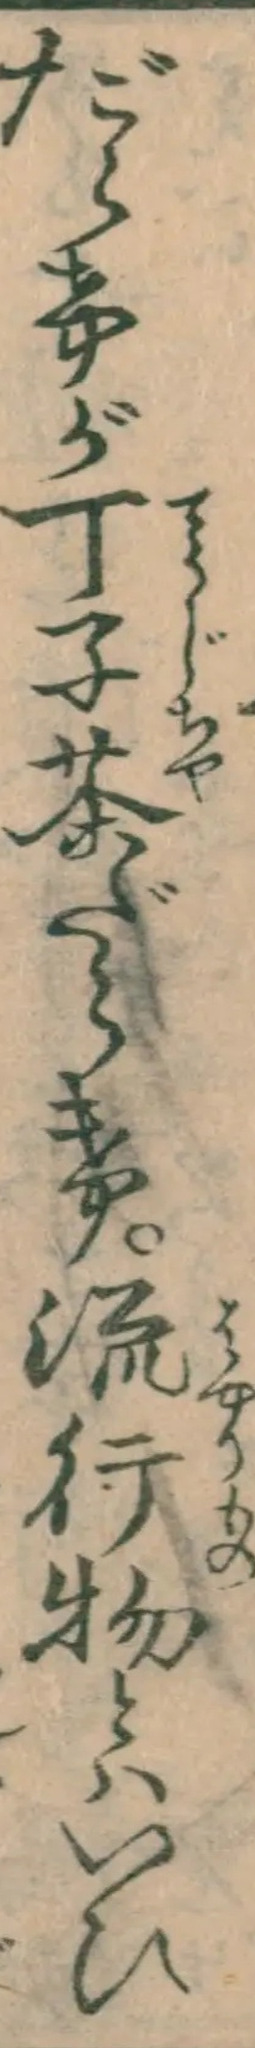だらけが丁子茶だらけ。流行物とはいひ
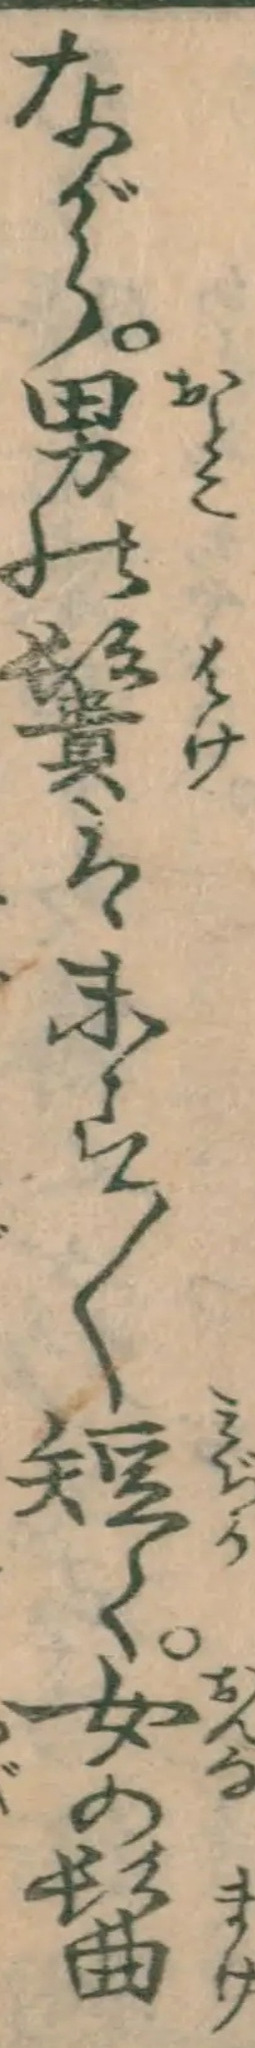ながら。男の䰎はます〳〵短く。女の髷
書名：麻疹戯言
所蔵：国立国会図書館 National Diet Library, JAPAN
